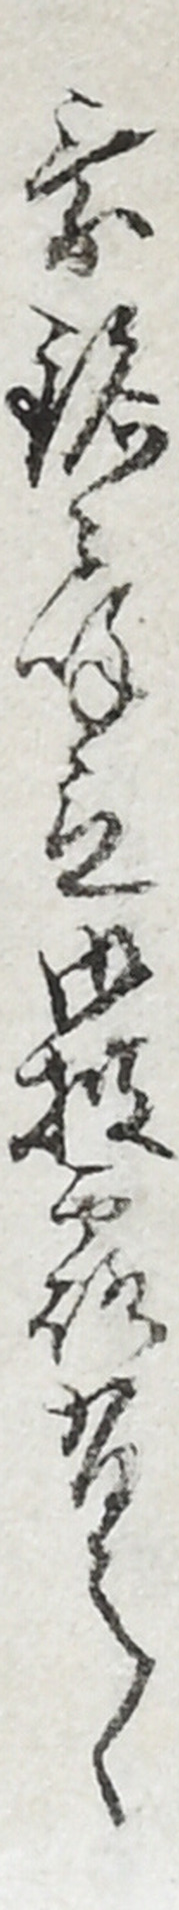乗銘々呼立御披露有之候
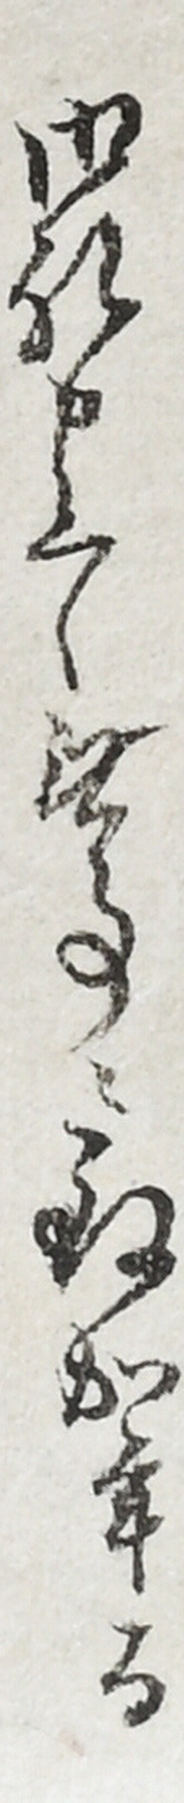御礼申上候無事ニ致加年而
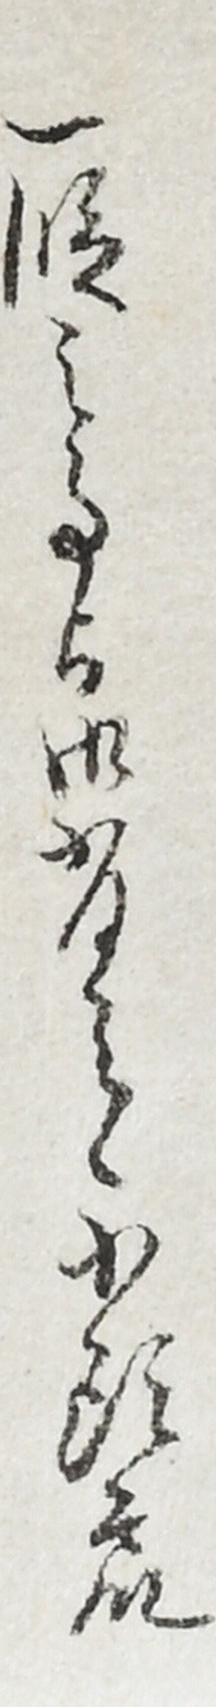一段之事と御有之候小頭衆
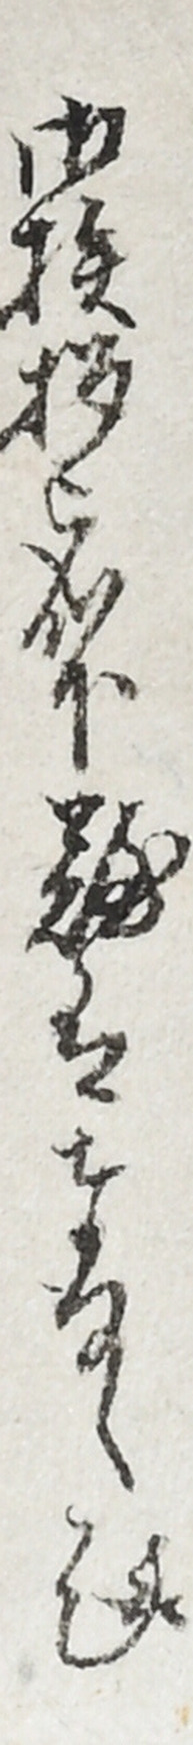御挨拶被成下難有奉存候趣
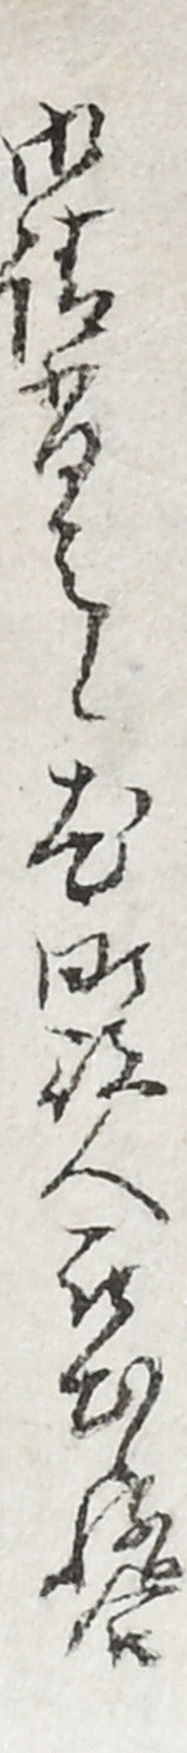御請有之候尤町役人罷出候様合
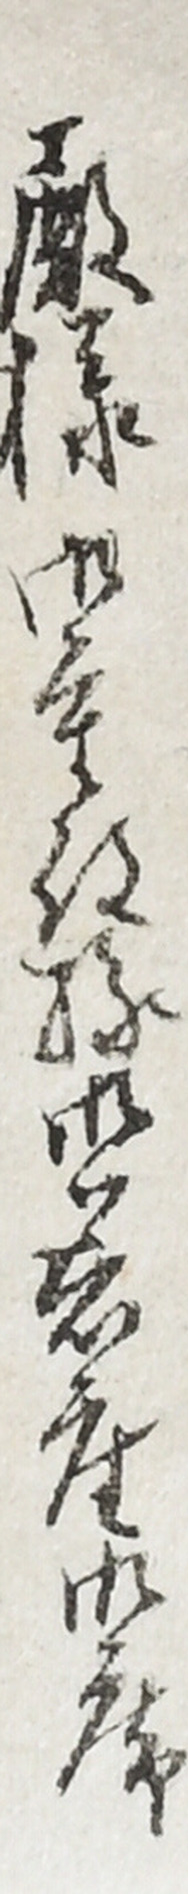殿様御重役様御着座御席
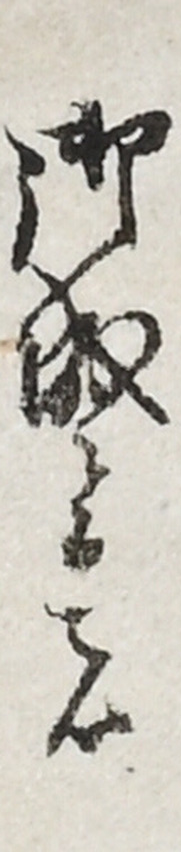御成ニ而は
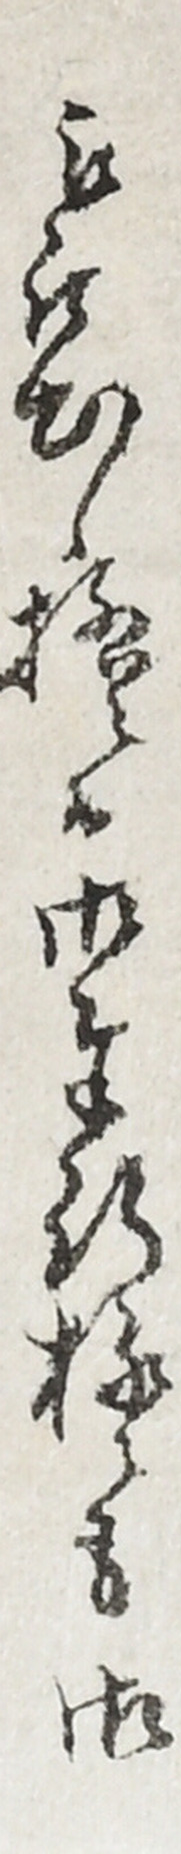江被出候様ニ而御奉行様ニも御
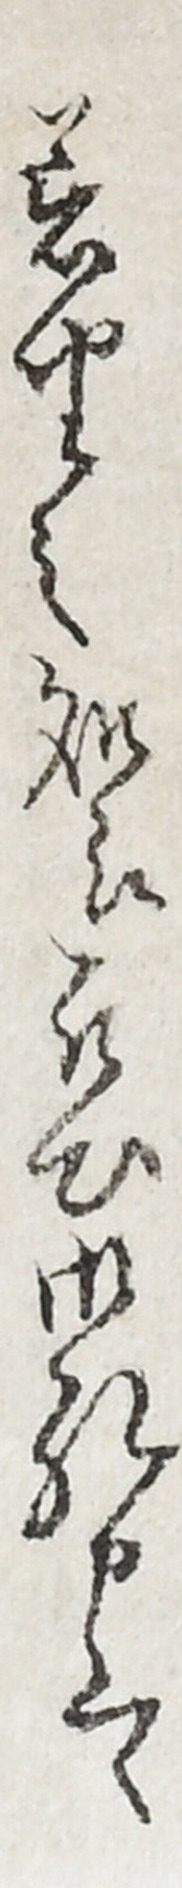着座之処江被出御礼申上候
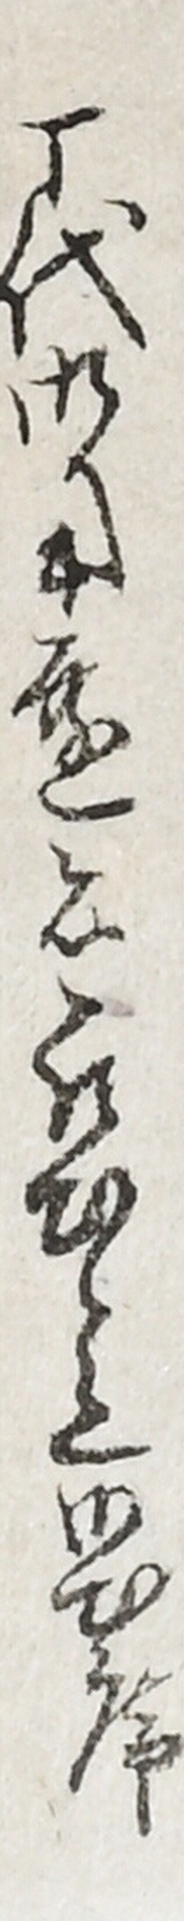丁代御用達は被出候上御出席
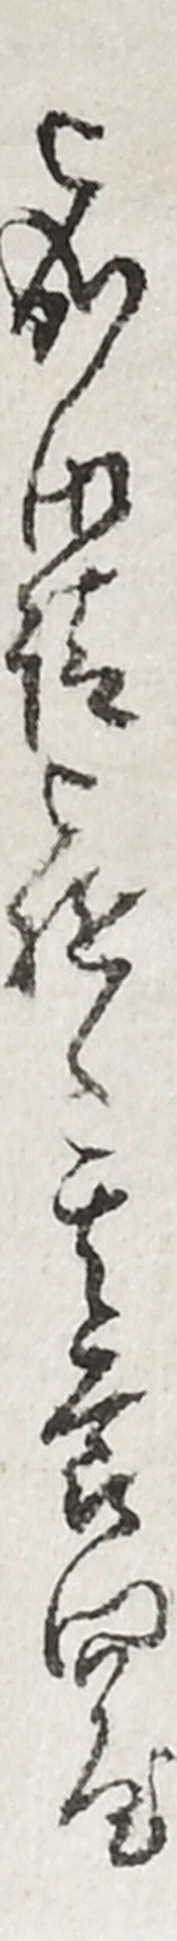被成御請被遊候其節問屋
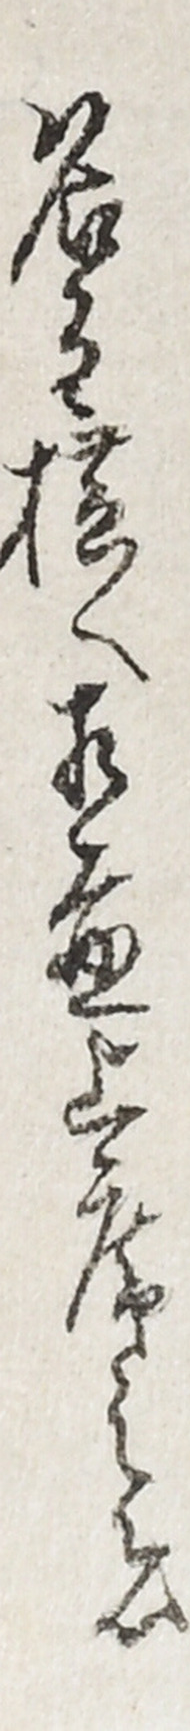名主様へ相並上席之者
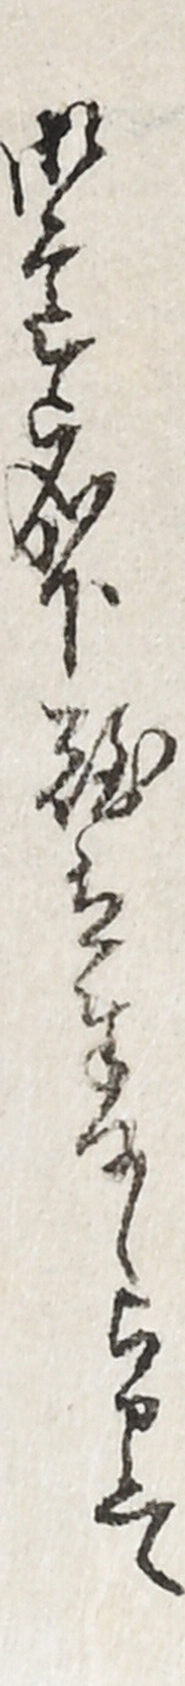御意被成下難有奉存候と申上候
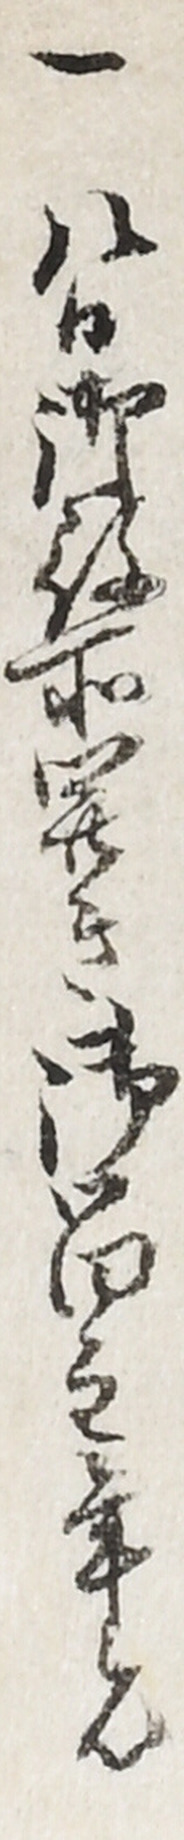一八日御役所開き御留主年は
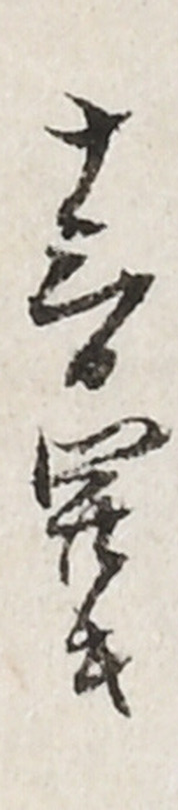十三日開キ
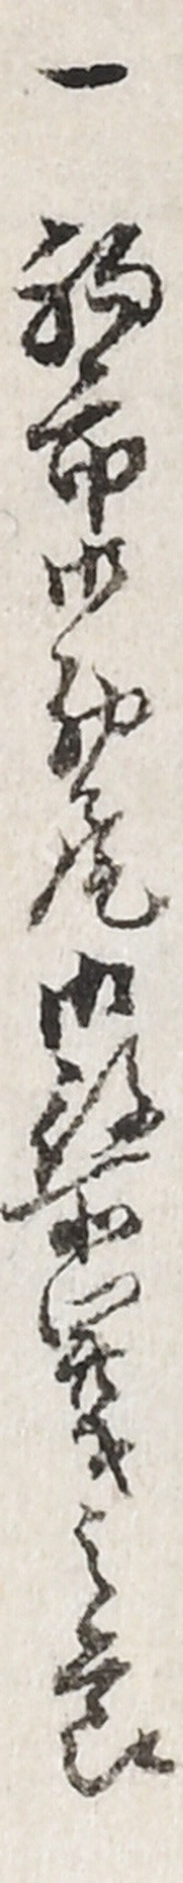一初市御初尾御役所開キ之節
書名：年内行事懐中録
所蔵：伊那市立高遠町図書館・合同会社AMANE
